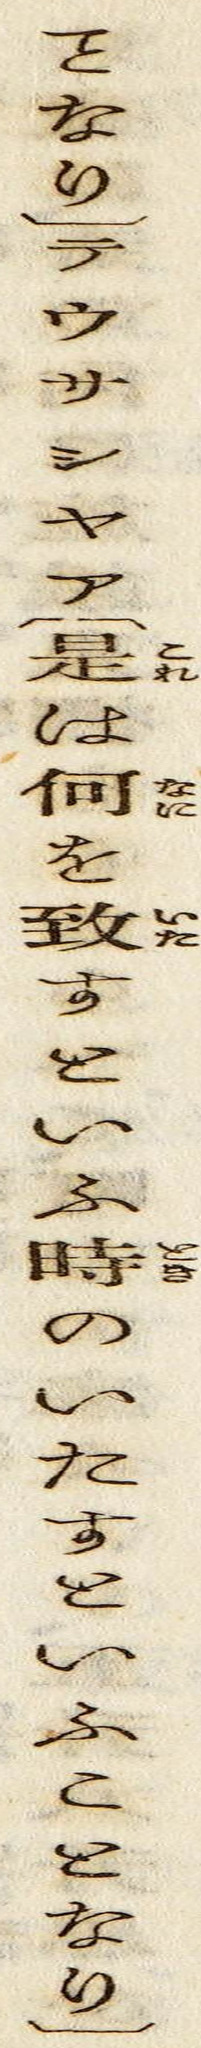ことなり]テウサシヤア[是は何を致すといふ時のいたすといふことなり]
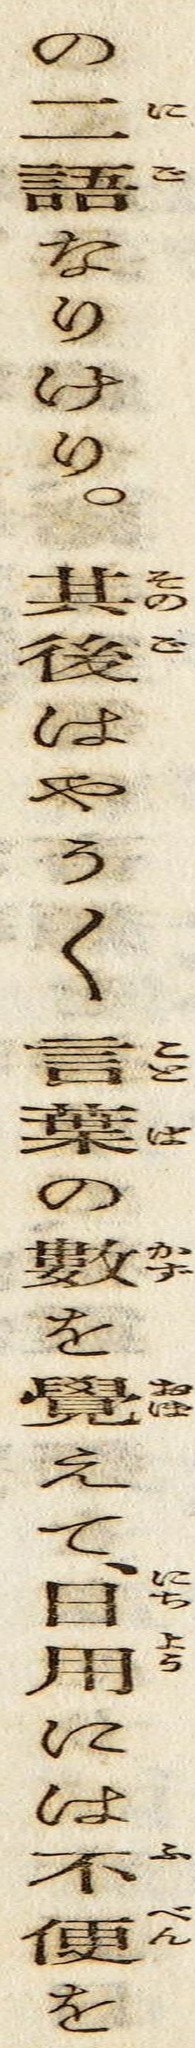の二語なりけり。其後はやう〳〵言葉の数を覚えて、日用には不便を
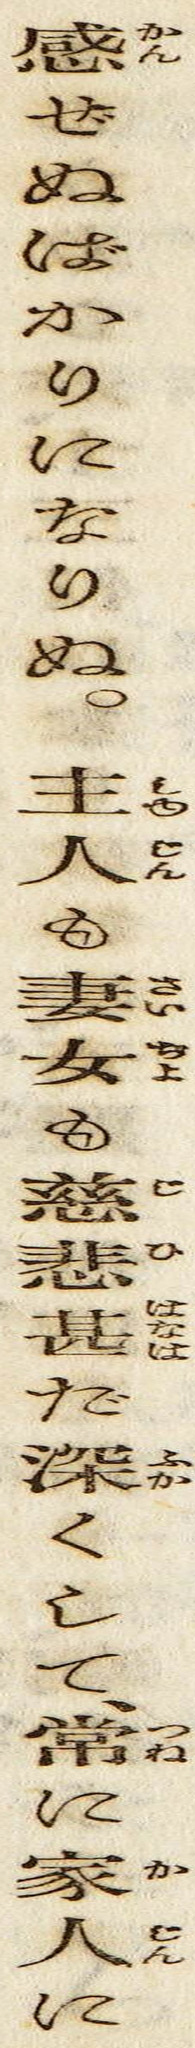感ぜぬばかりになりぬ。主人も妻女も慈悲甚だ深くして、常に家人に
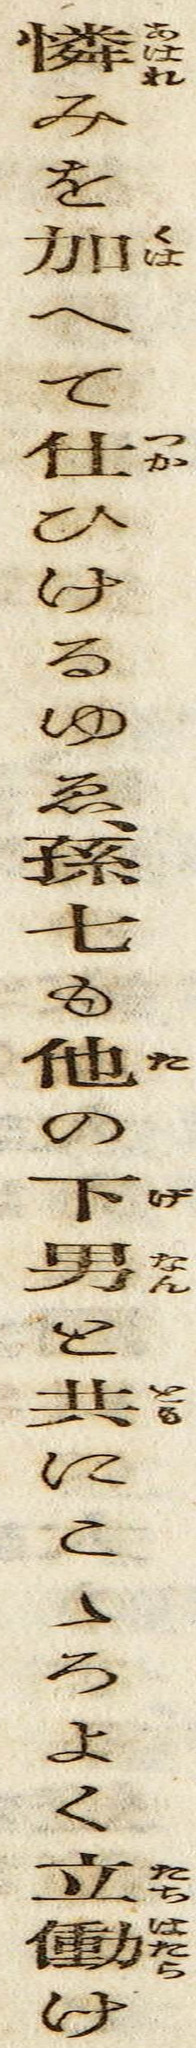憐みを加へて仕ひけるゆゑ、孫七も他の下男と共にこゝろよく立働け

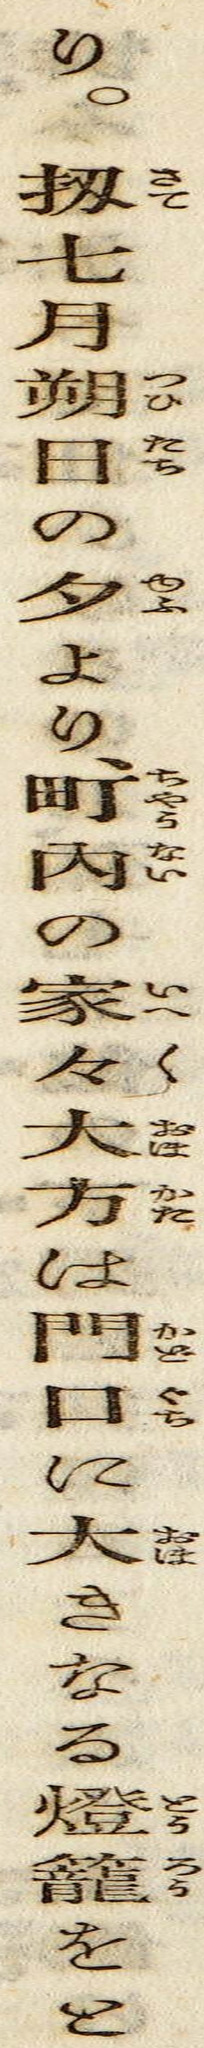り。扨七月朔日の夕より、町内の家々大方は門口に大きなる灯籠をと
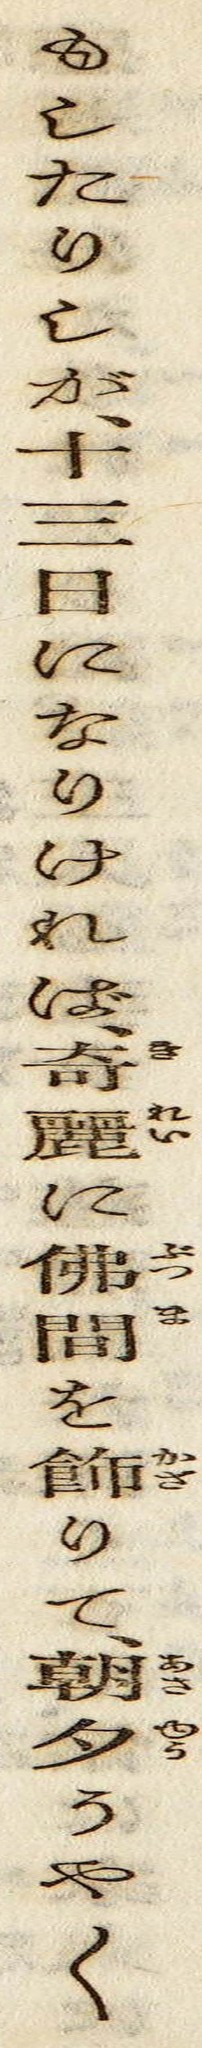もしたりしが、十三日になりければ、奇麗に仏間を飾りて、朝夕うや〳〵
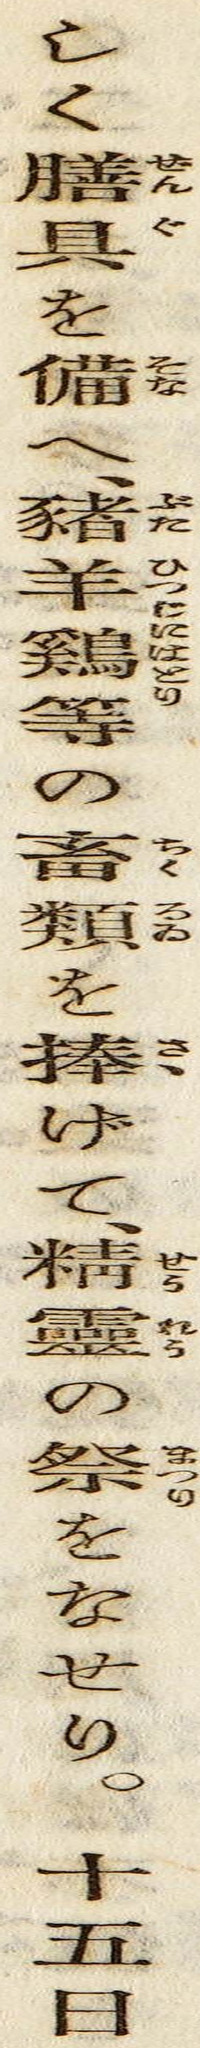しく膳具を備へ、猪羊鶏等の畜類を捧げて、精霊の祭をなせり。十五日
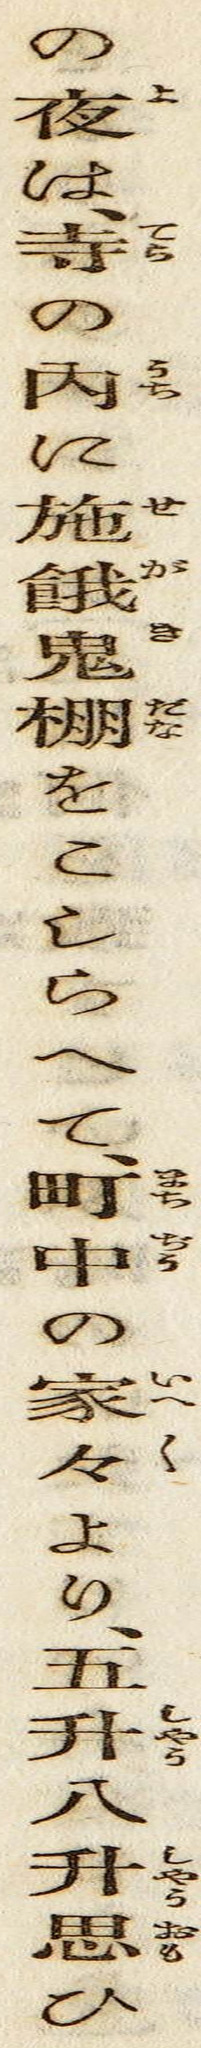の夜は、寺の内に施餓鬼棚をこしらへて、町中の家々より、五升八升思ひ
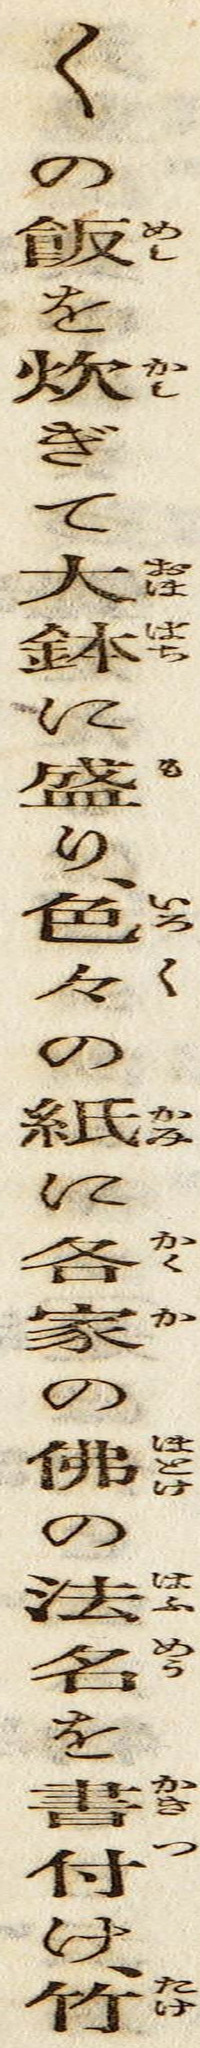〳〵の飯を炊ぎて大鉢に盛り、色々の紙に各家の仏の法名を書付け、竹
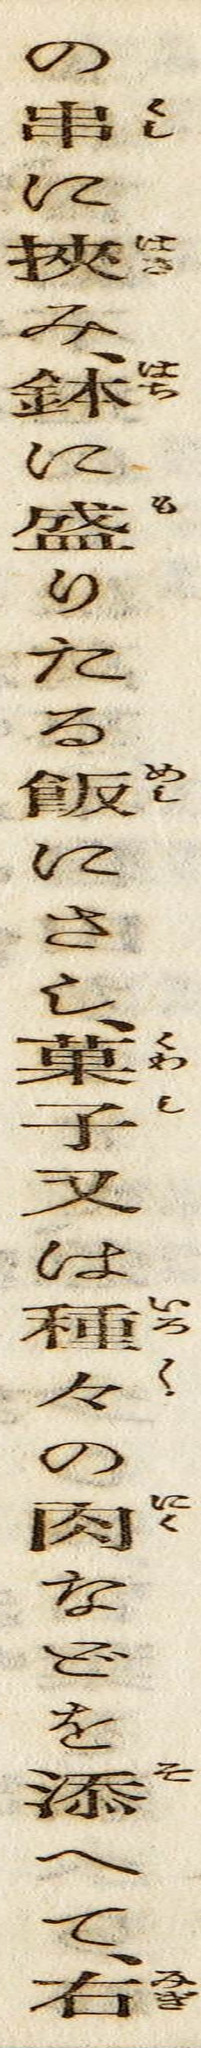の串に挟み、鉢に盛りたる飯にさし、菓子又は種々の肉などを添へて、右
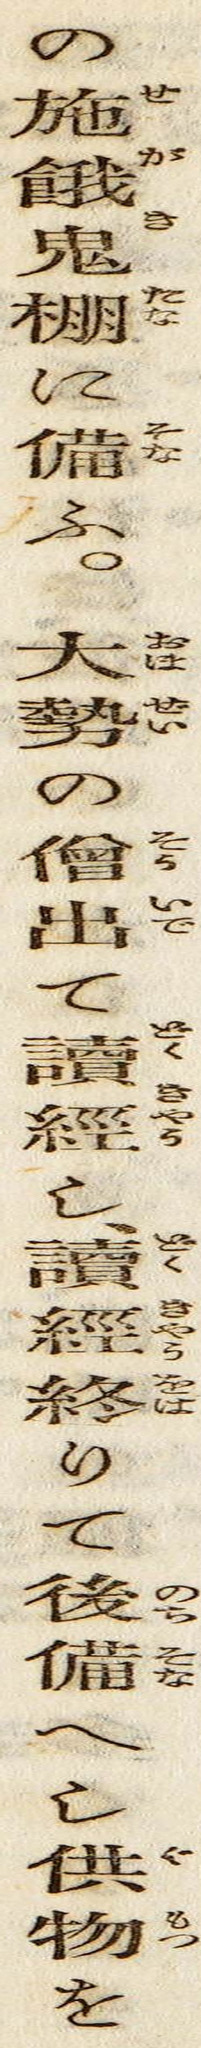の施餓鬼棚に備ふ。大勢の僧出て読経し、読経終りて後備へし供物を
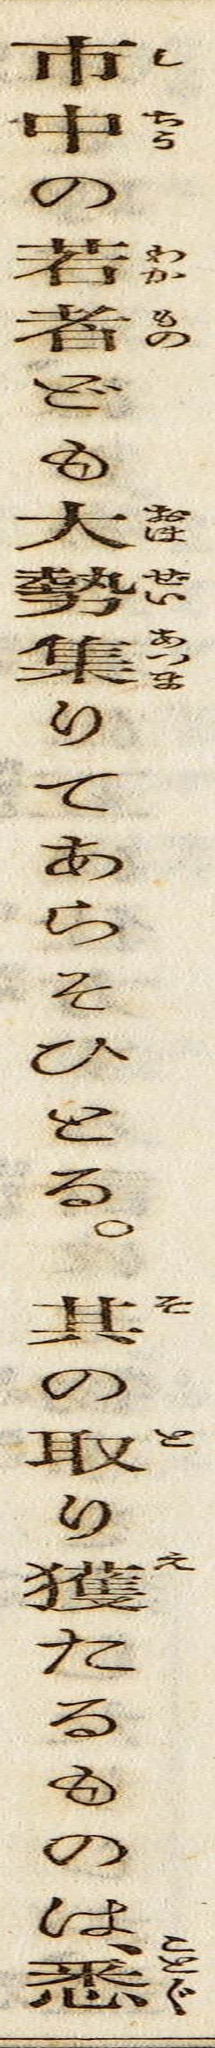市中の若者ども大勢集りてあらそひとる。其の取り獲たるものは、悉
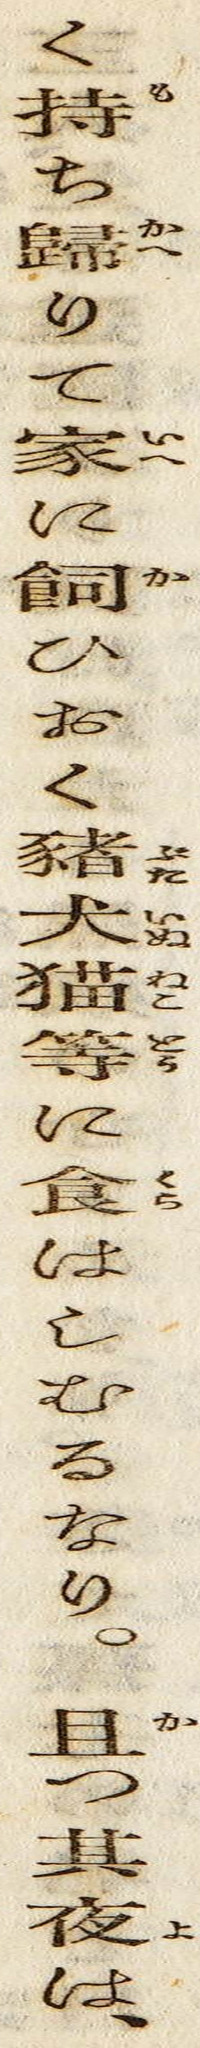く持ち帰りて家に飼ひおく猪犬猫等に食はしむるなり。且つ其夜は、
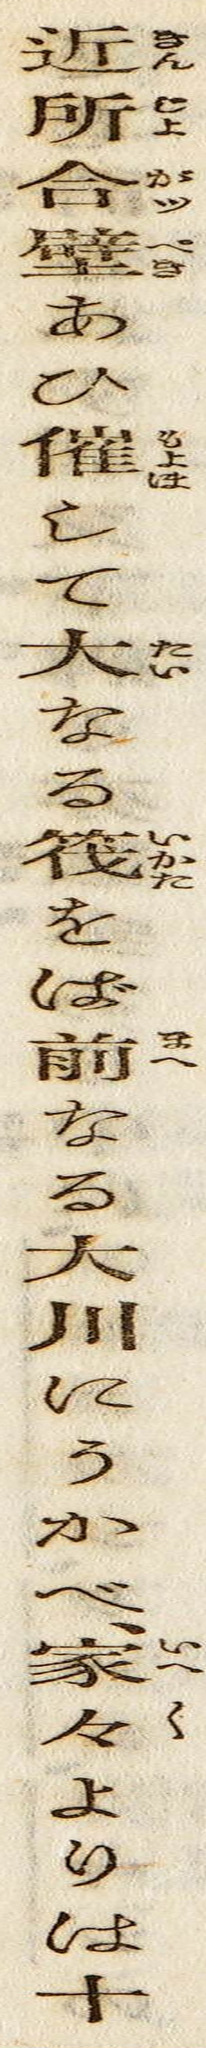近所合壁あひ催して大なる筏をば前なる大川にうかべ、家々よりは十
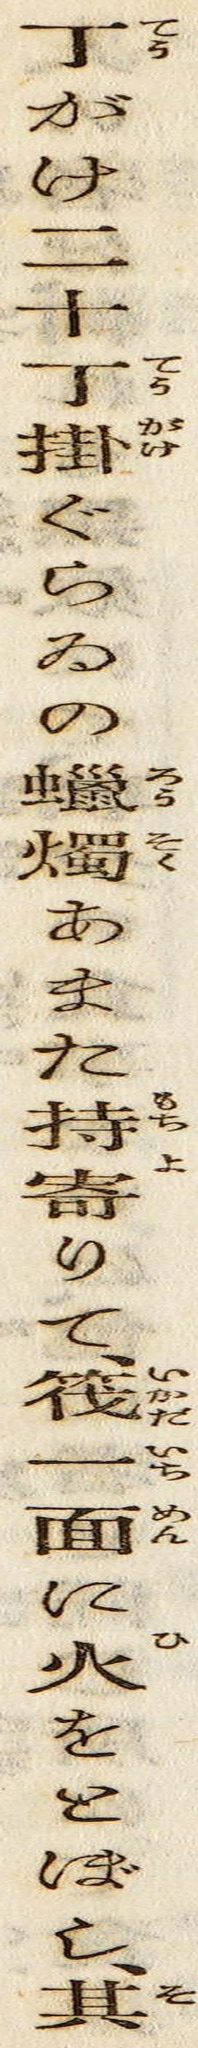丁がけ二十丁掛ぐらゐの蝋燭あまた持寄りて、筏一面に火をとぼし、其
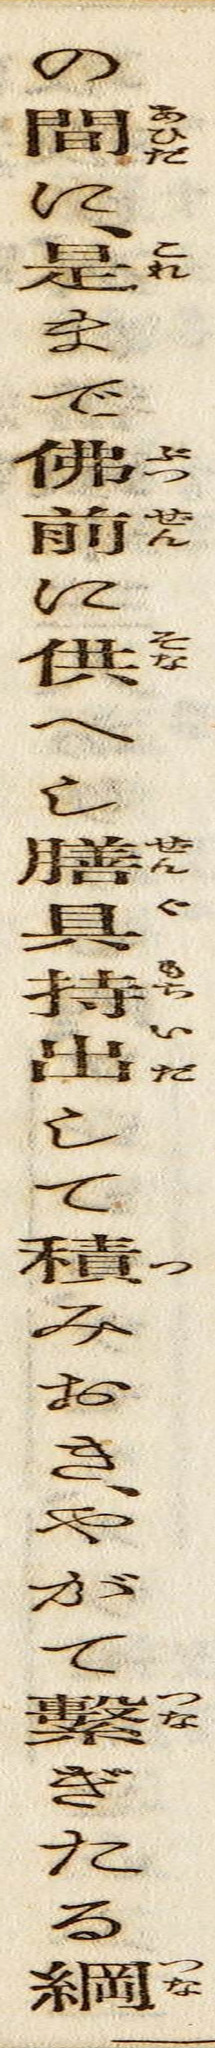の間に、是まで仏前に供へし膳具持出して積みおき、やがて繋ぎたる綱
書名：日本漂流譚
